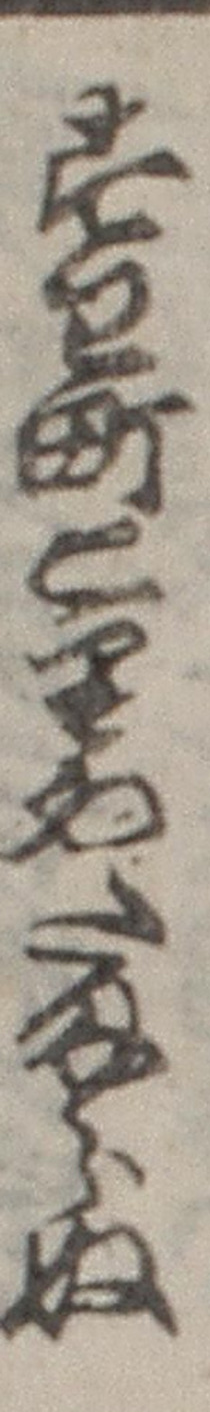すわ町こりやたまらぬ
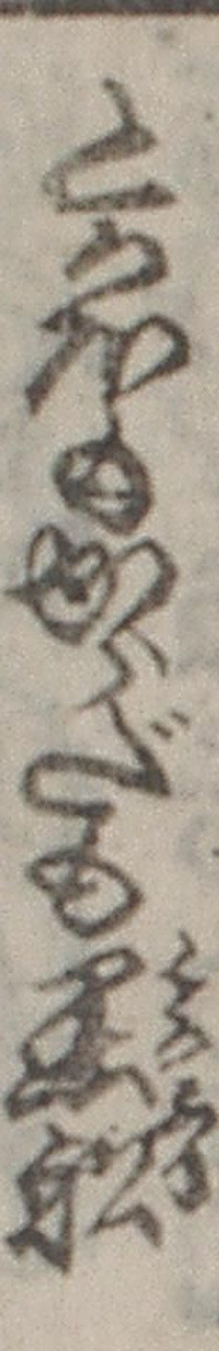とかほもからだも黒船
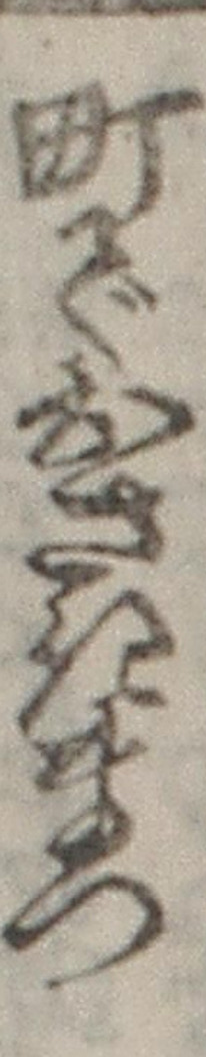町でおさきまつ
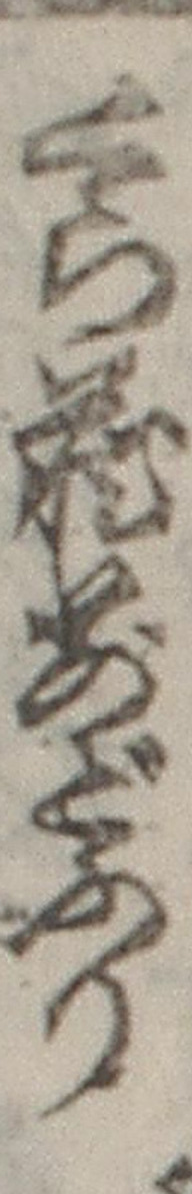くら蔵前どふり
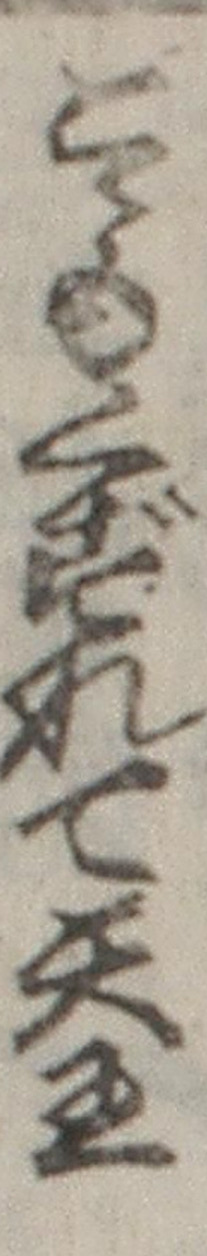こゝもくずれて天王
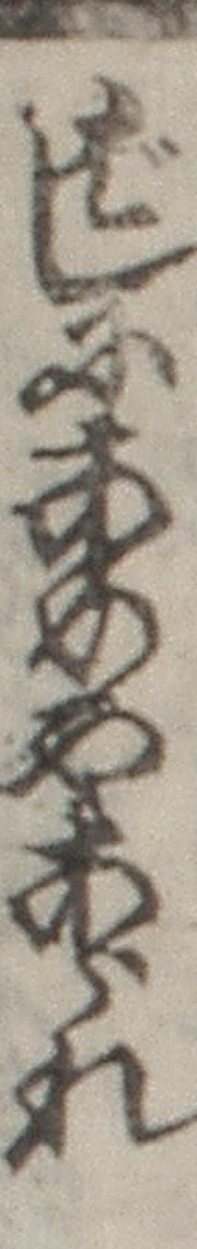ばしにあめやあられ
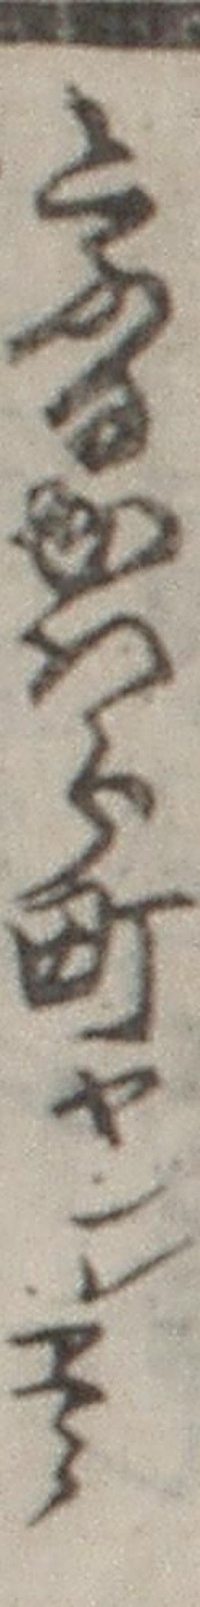とふるかはら町ヤンレエゝ
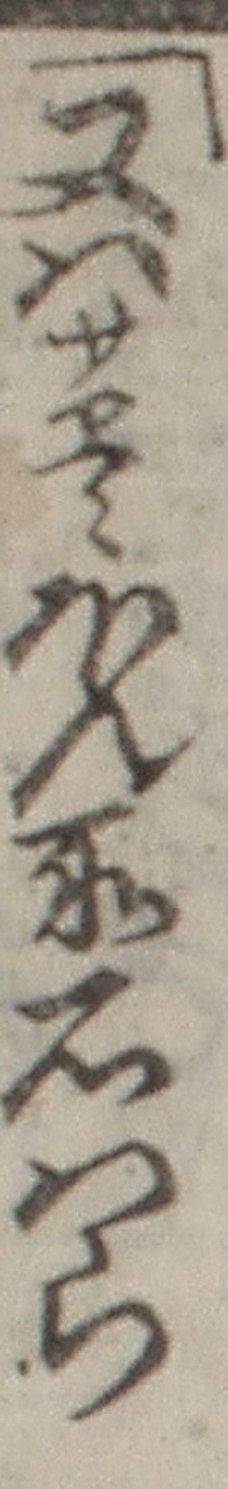又はサエゝほん所石はら

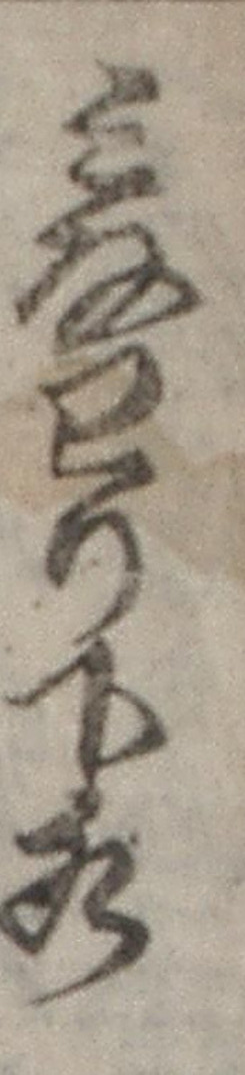みなわり下水
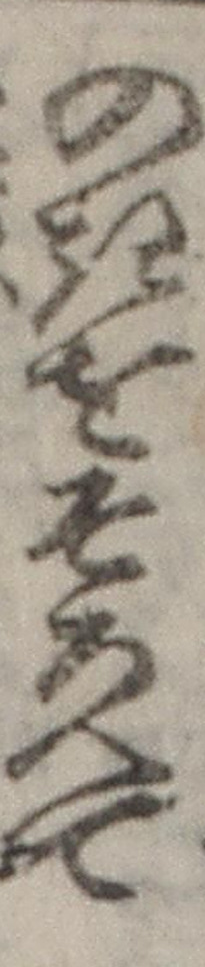のきをそろへて
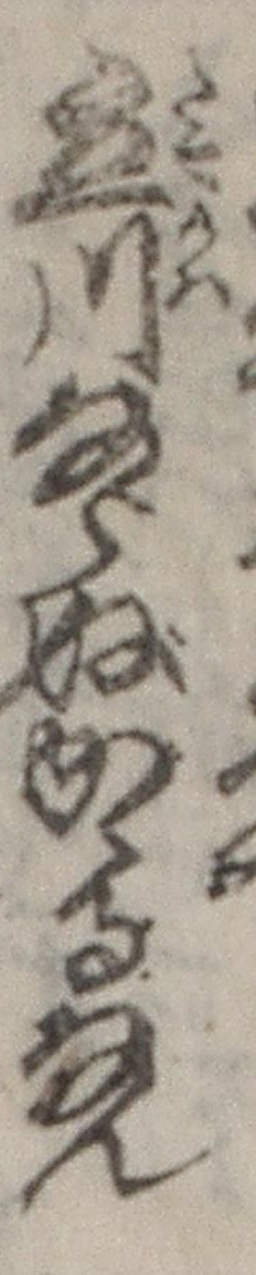立川ならぬかゝるなん
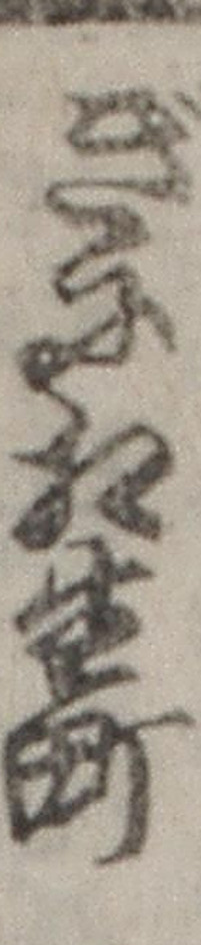ぎに相生町
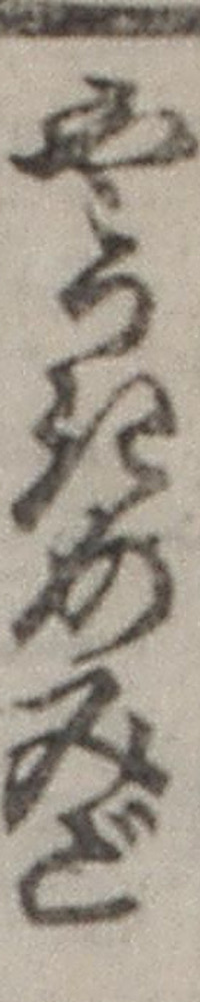やうきめみど
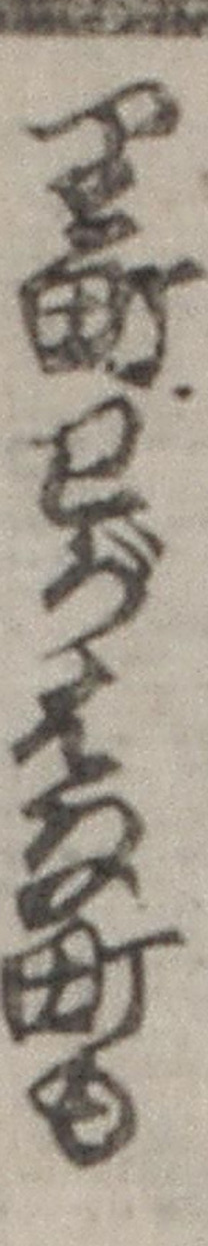り町わがはな町も
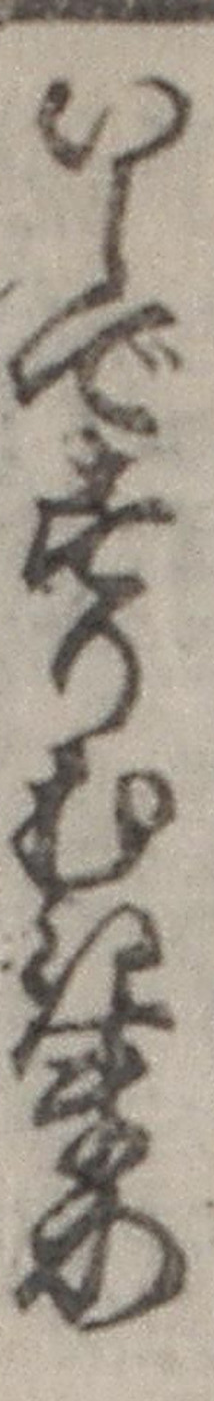いしですりむきまめ？
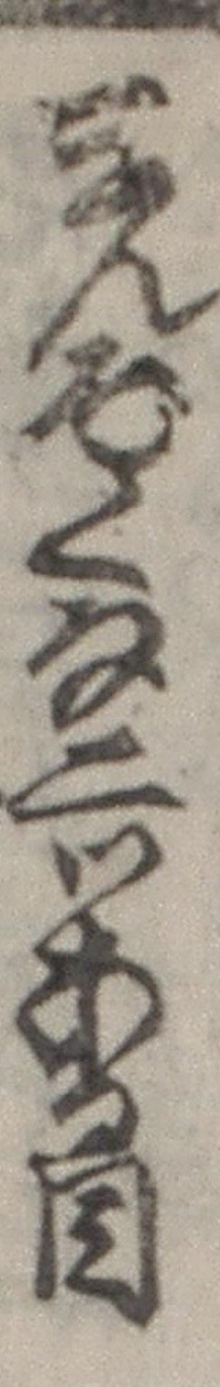まんぞくな二つある目
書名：安政二卯年　江戸大地震并出火附
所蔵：東京大学地震研究所図書室 Earthquake Research Institute Library, The University of Tokyo, JAPAN
